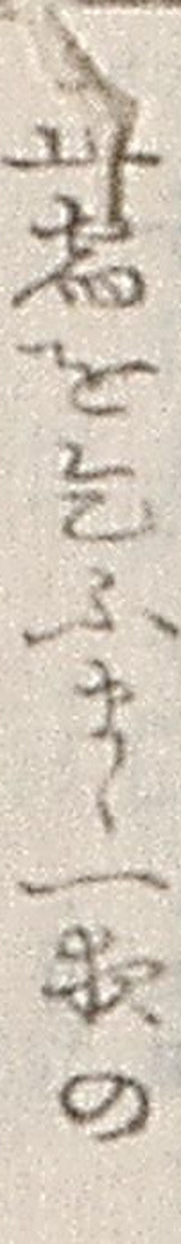止宿を乞ふまゝ一夜の
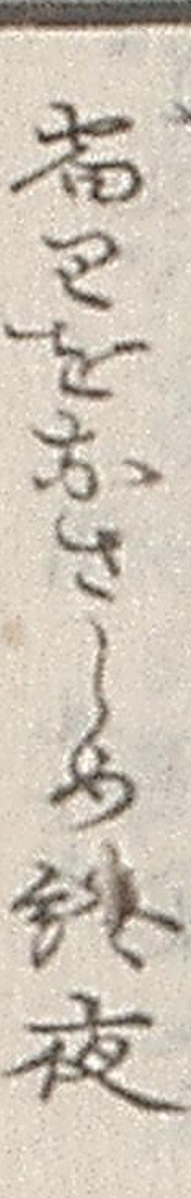宿りをなさしめ終夜
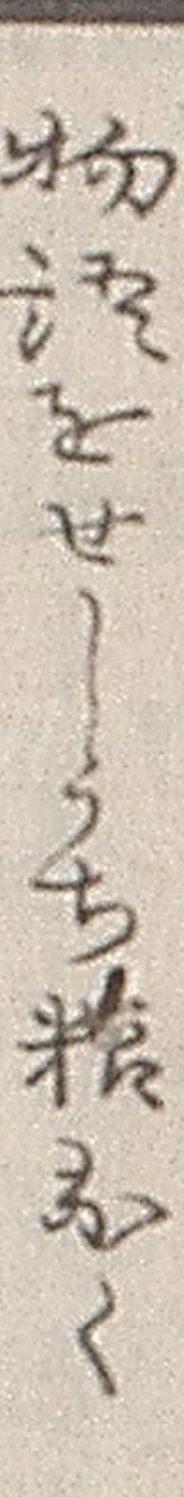物語をせしうち粮なく
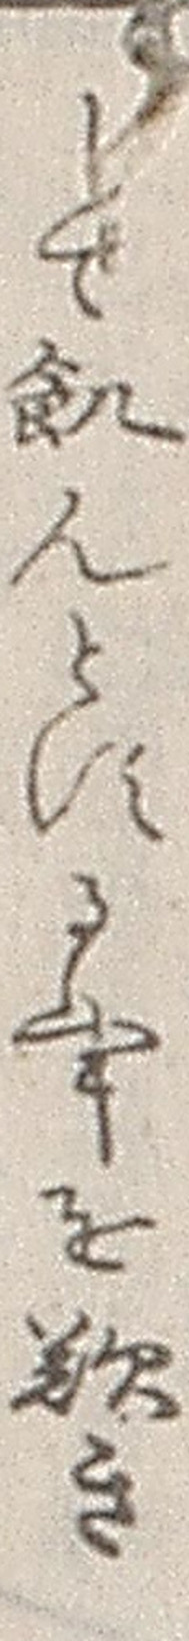して飢んとする事を歎き
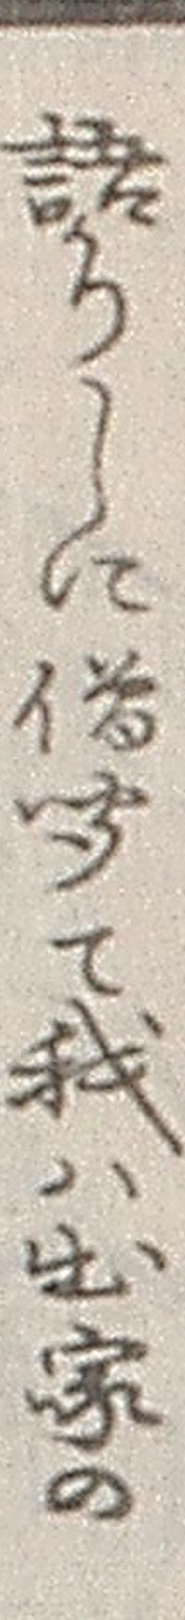語りしに僧聞て我は出家の
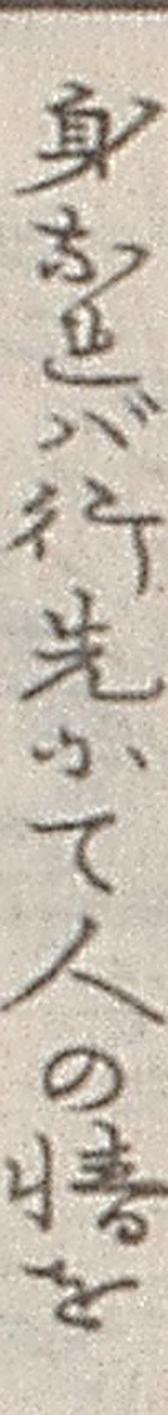身なれば行先にて人の情を
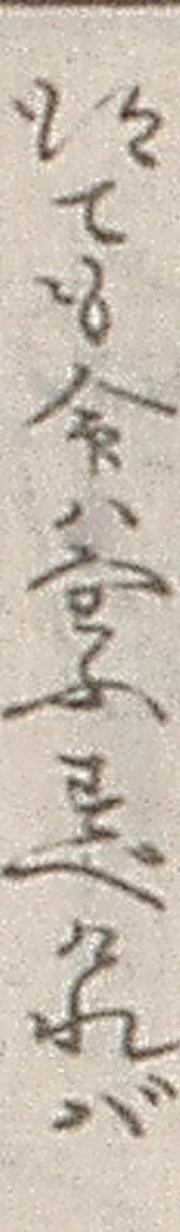得ても命は全ふすべければ
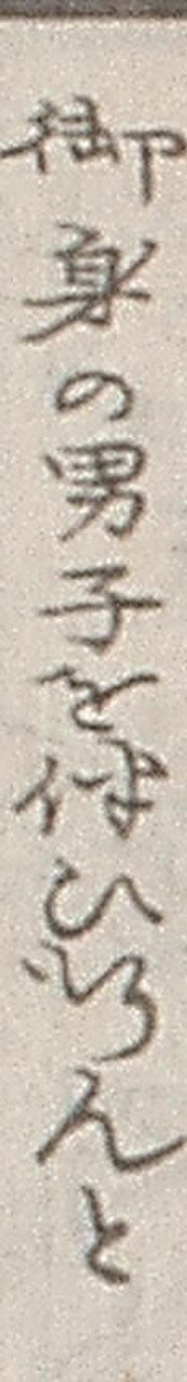御身の男子を伴ひ行んと
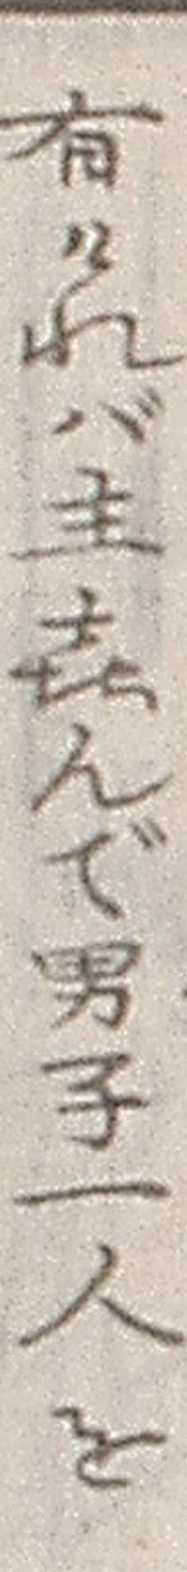有ければ主喜んで男子一人を
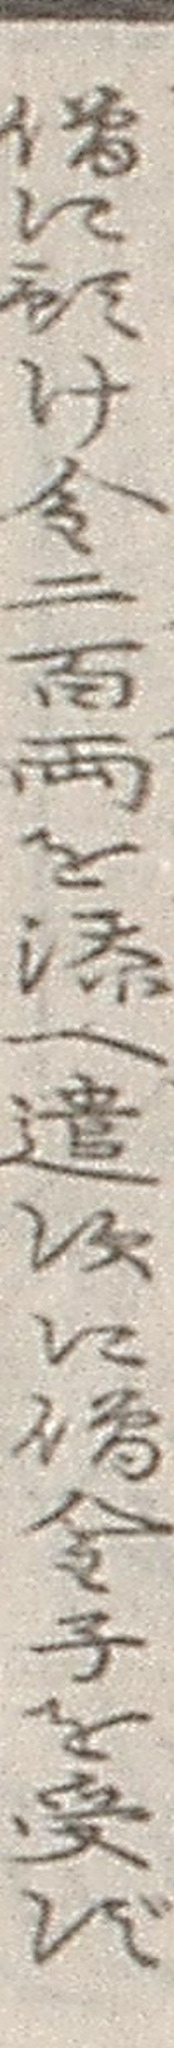僧に預け金二百両を添へ遣すに僧金子を受ず
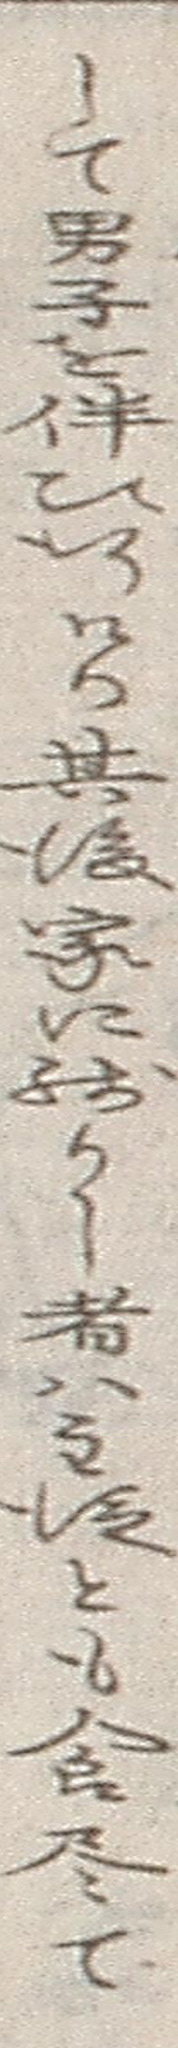して男子を伴ひ行けり其後家に残りし者は主従とも食尽て
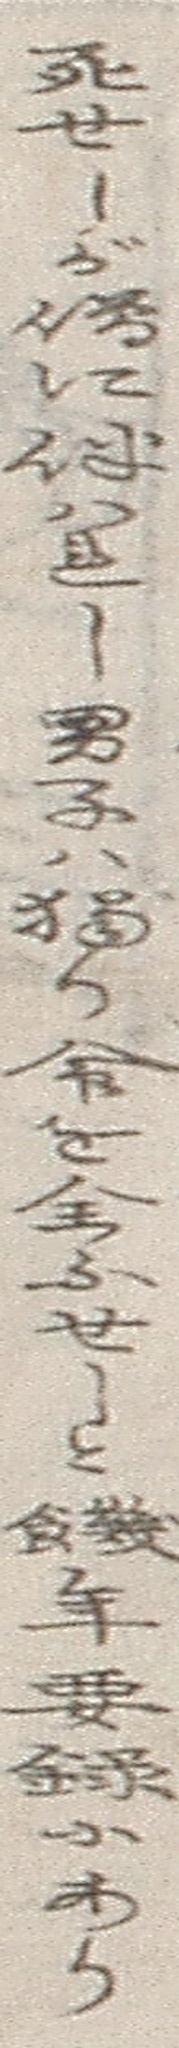死せしが僧に伴はれし男子は独り命を全ふせしと饑年要録にあり

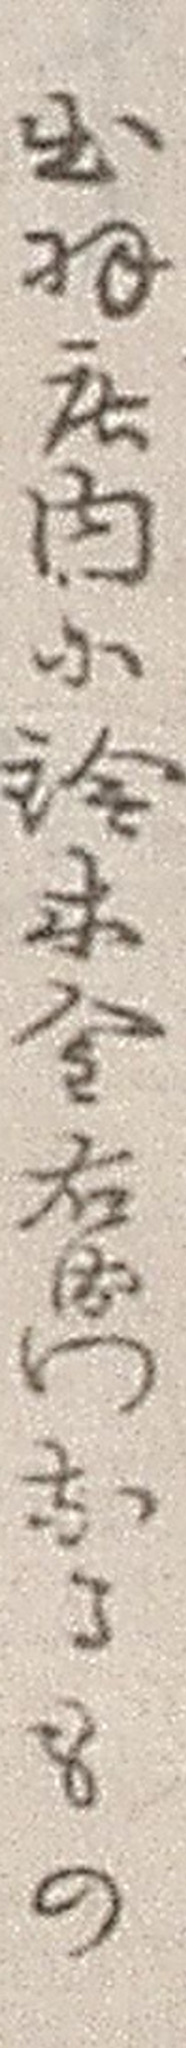出羽庄内に鈴木金右衛門なるもの
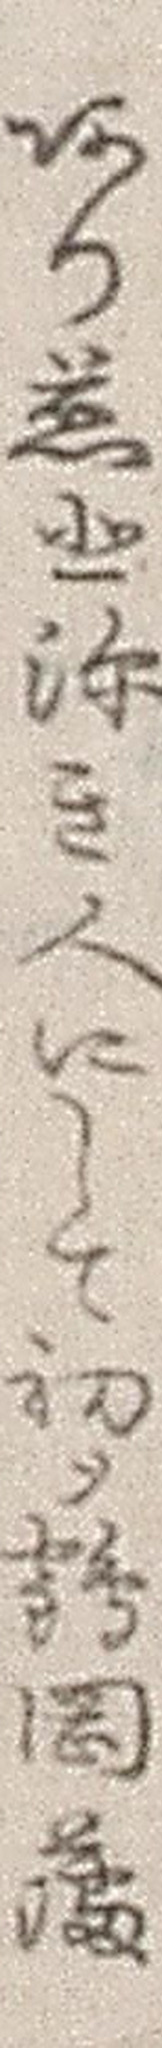あり慈悲深き人にして初メ鶴岡藩
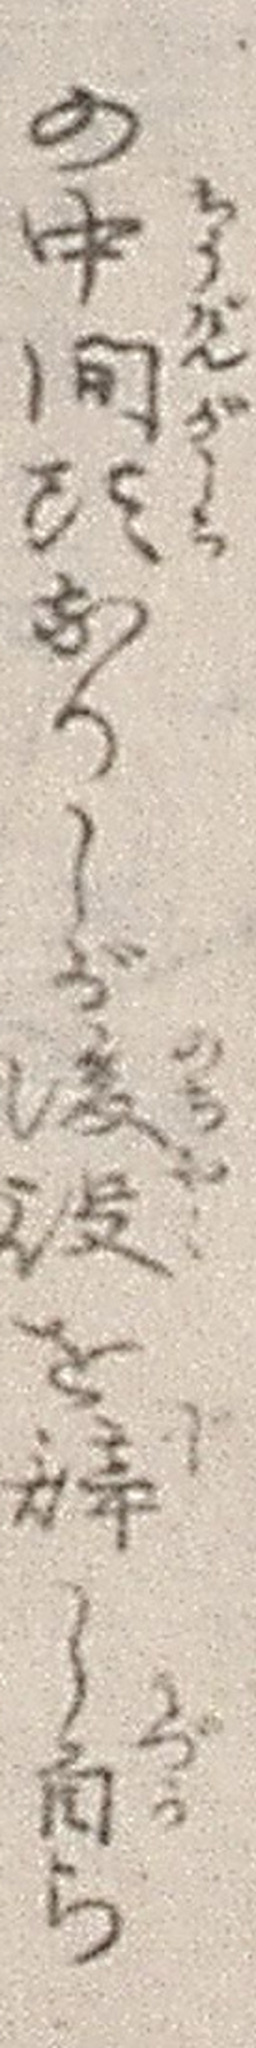の中間頭なりしが後役を辞し自ら
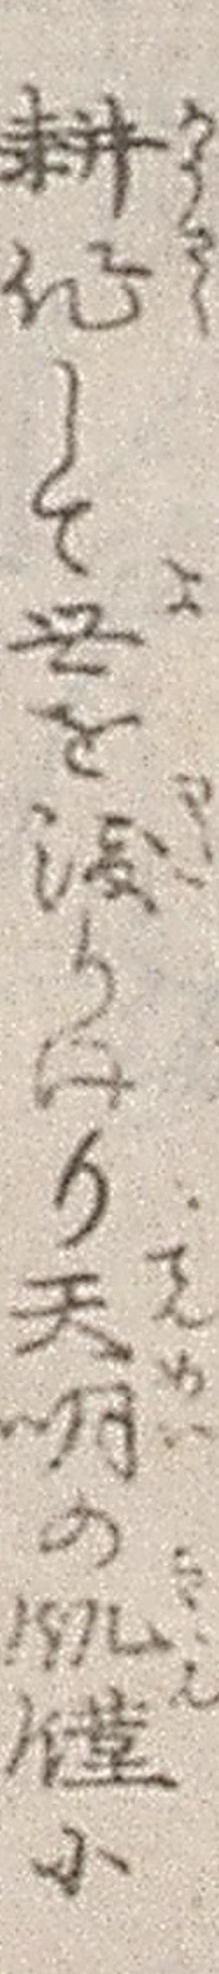耕作して世を渡りけり天明の飢饉に
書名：凶荒図録　完
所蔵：東京大学地震研究所図書室 Earthquake Research Institute Library, The University of Tokyo, JAPAN
